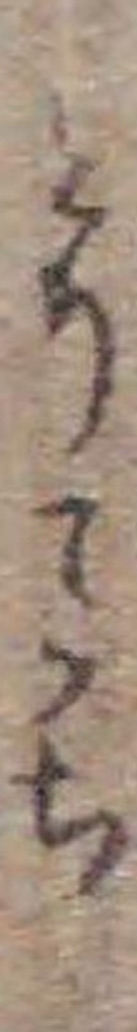とりてかち
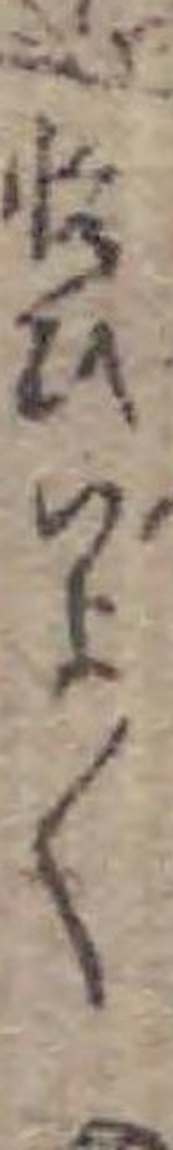悦ひいよ〳〵
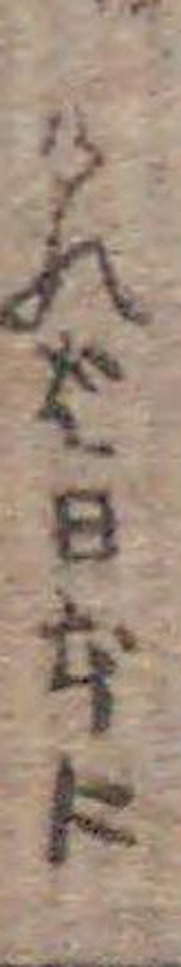ければ日本に
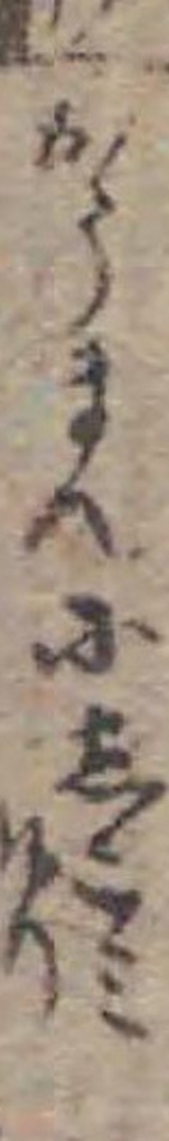かうまんにしこみ
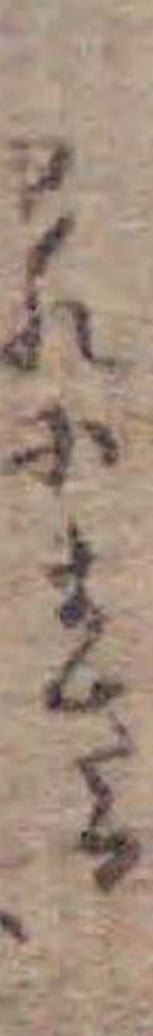われにまさる
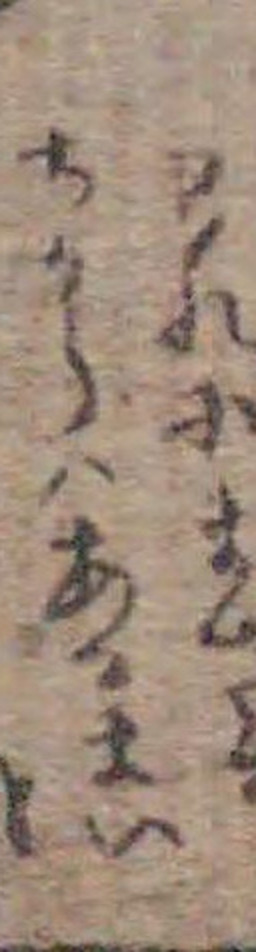ちからはあるまいと
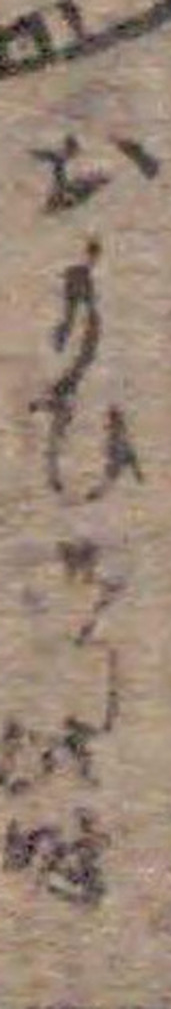おもひけり此時
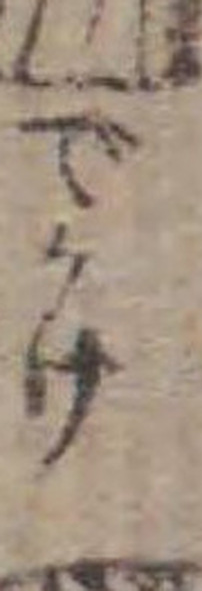でかけ
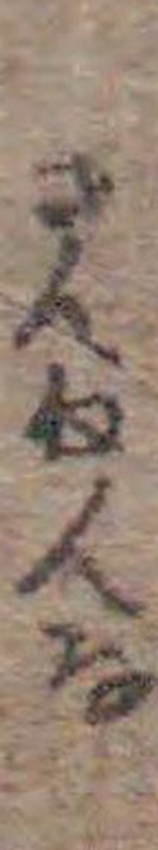ざんねんな
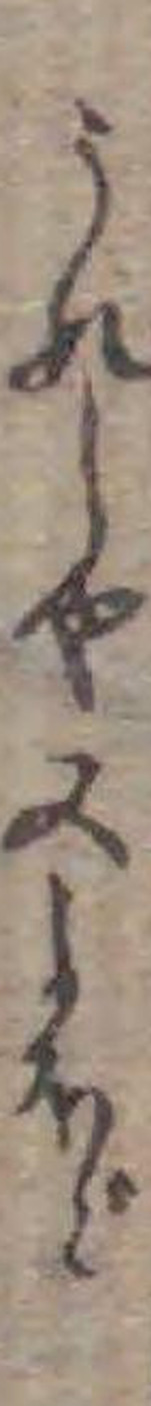うれしや又よほど
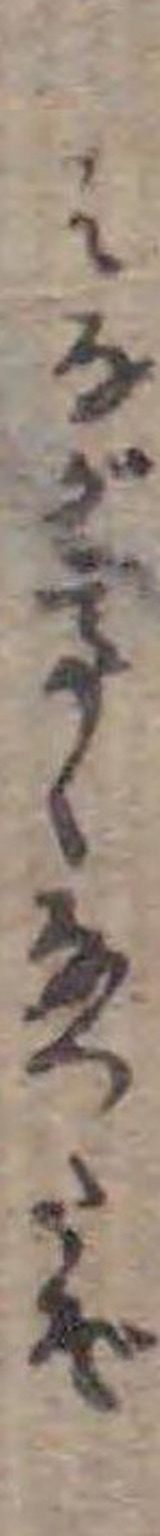はなが高くなつたぞ
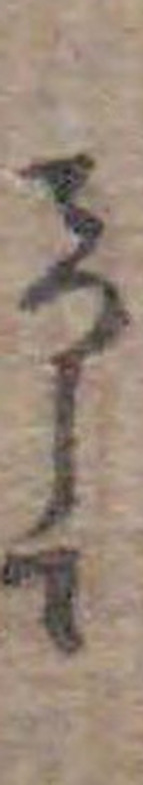てつして

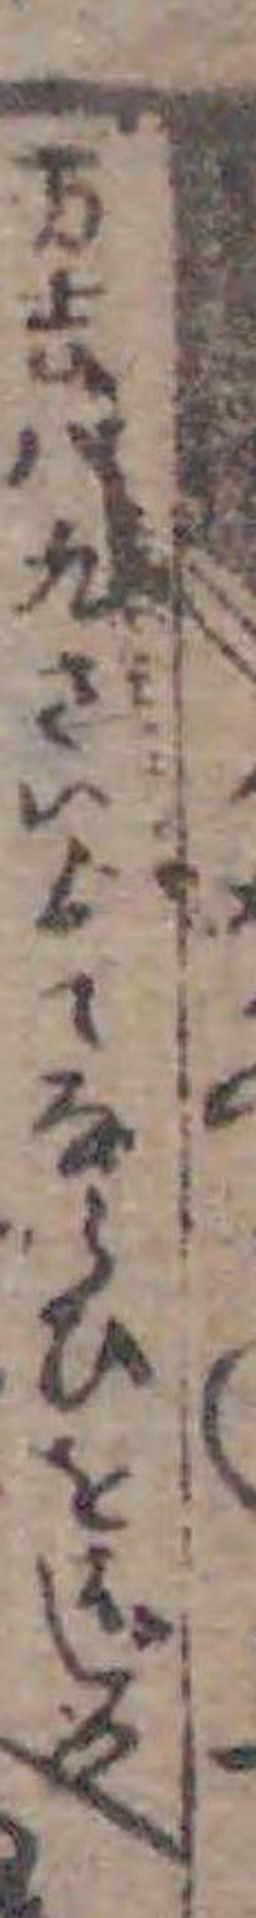万吉は九さいよりてならひをはじめ
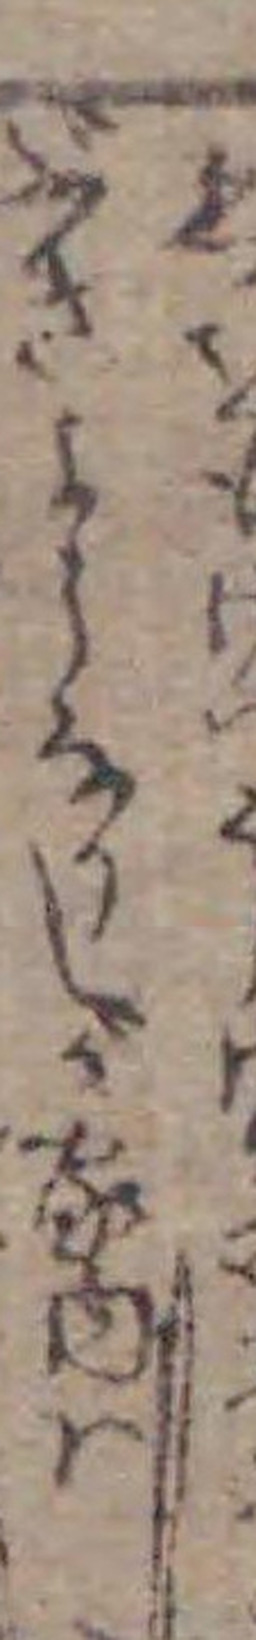ぶきようなりしが家内は
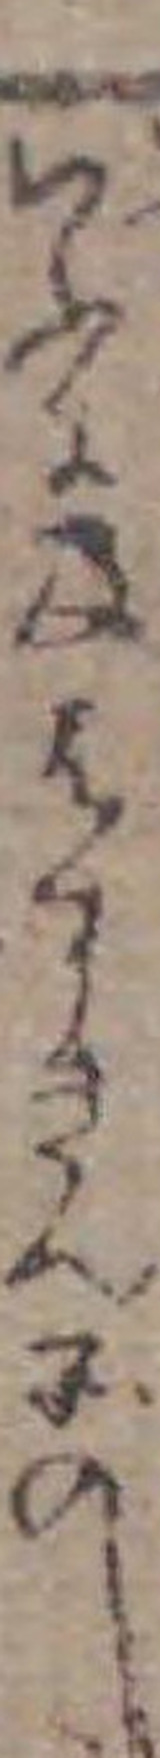いふに及はすきん所の
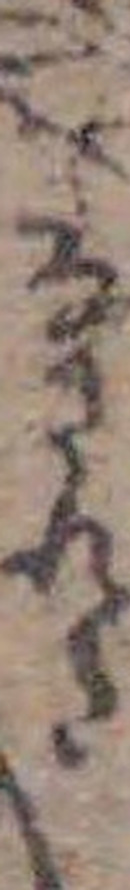なされた
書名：鼻峰高慢男 : 2巻
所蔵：国立国会図書館 National Diet Library, JAPAN
